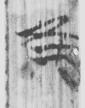隹
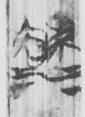灋
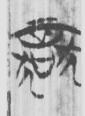獄
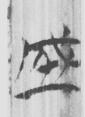城
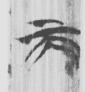而
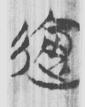逾
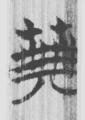典
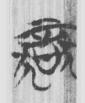獄
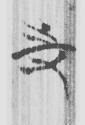寺
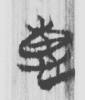惠
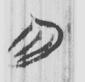勿
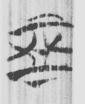亞
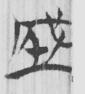城
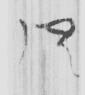{丨卩}
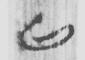㠯（以）
